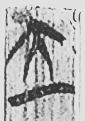立
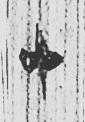十
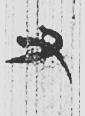又
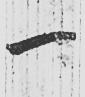一
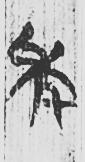年
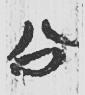公
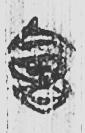會
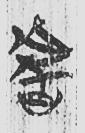者
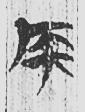侯
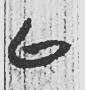㠯（以）
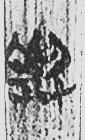與
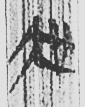吳
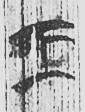王
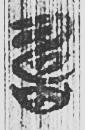𠷎
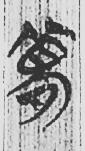夢
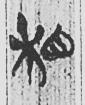相
